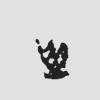從
